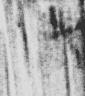{言女}（恕）
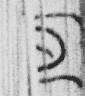宜（義）
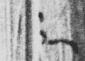之
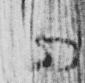方
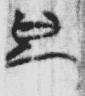也
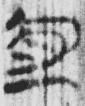宜（義）
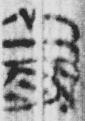敬
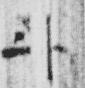之
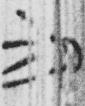方
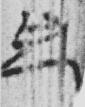也
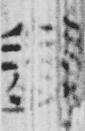敬
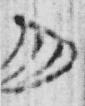勿（物）
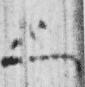之
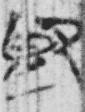即（節）
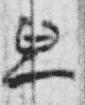也
